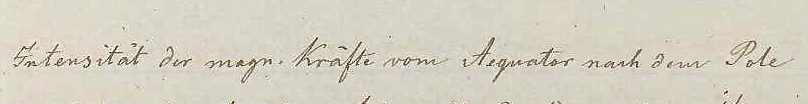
Intensität der magn. Kräfte vom Aequator nach dem Pole
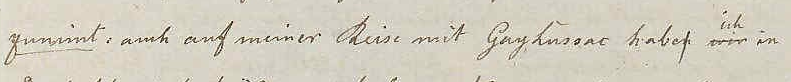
zunimt: auch auf meiner Reise mit Gay Lussac haben wirich in
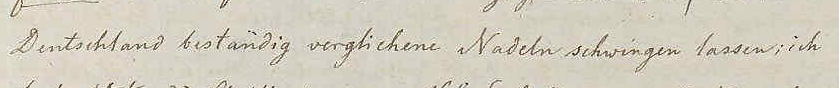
Deutschland beständig verglichene Nadeln schwingen lassen; ich
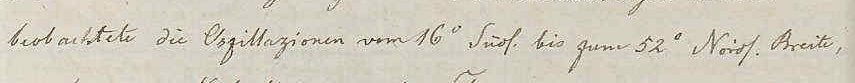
beobachtete die Oszillazion vom 16° Südl. bis zum 52° Nördl. Breite,
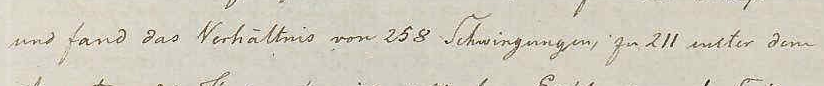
und fand das Verhältnis von 258 Schwingungen, zu 211 unter dem
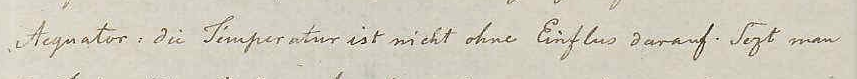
Aequator: die Temperatur ist nicht ohne Einflus darauf. Sezt man
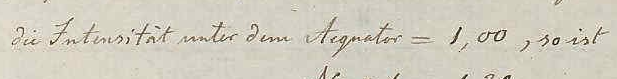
die Intensität unter dem Aequator 1,00, so ist
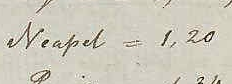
Neapel 1,20
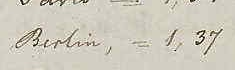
Berlin 1,37
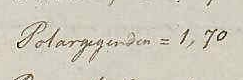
Polargegenden 1,70
